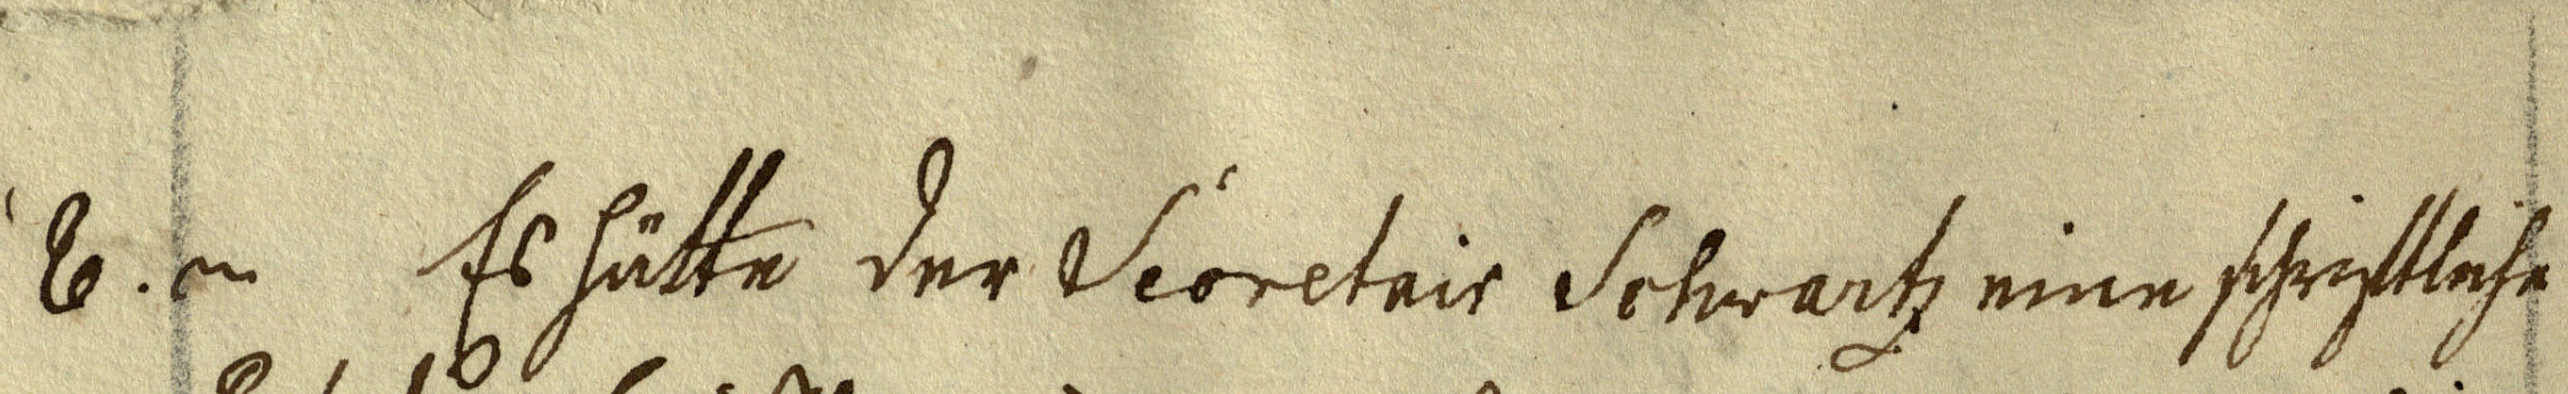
8. Es hätte der Secretair Schwartz eine schriftliche
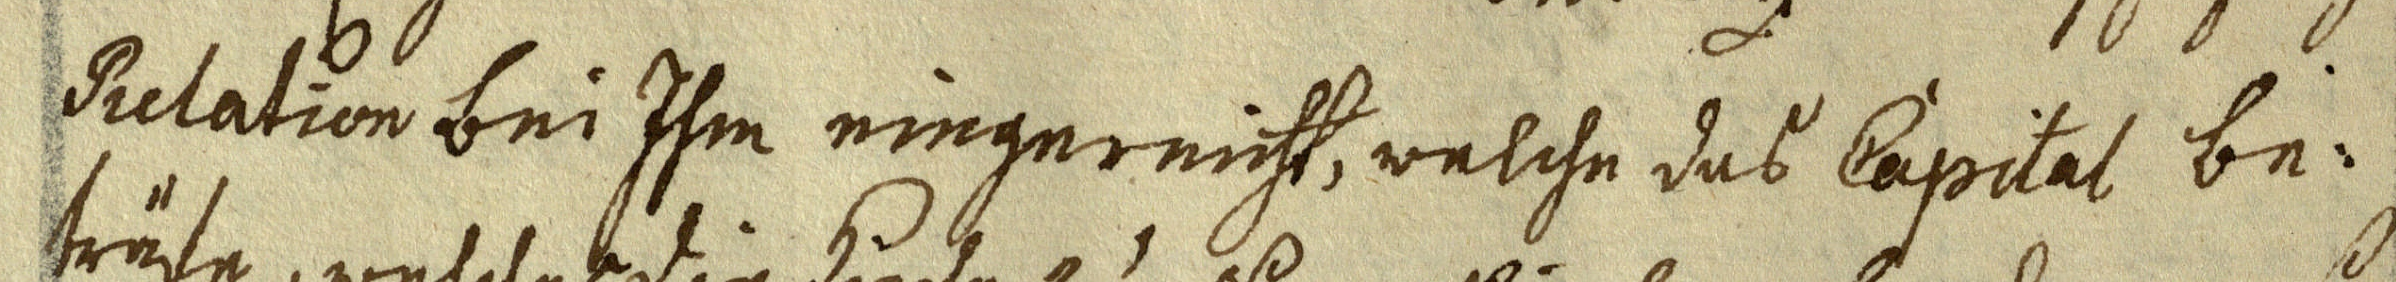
Relation bei Ihm eingereicht, welche das Capital be¬
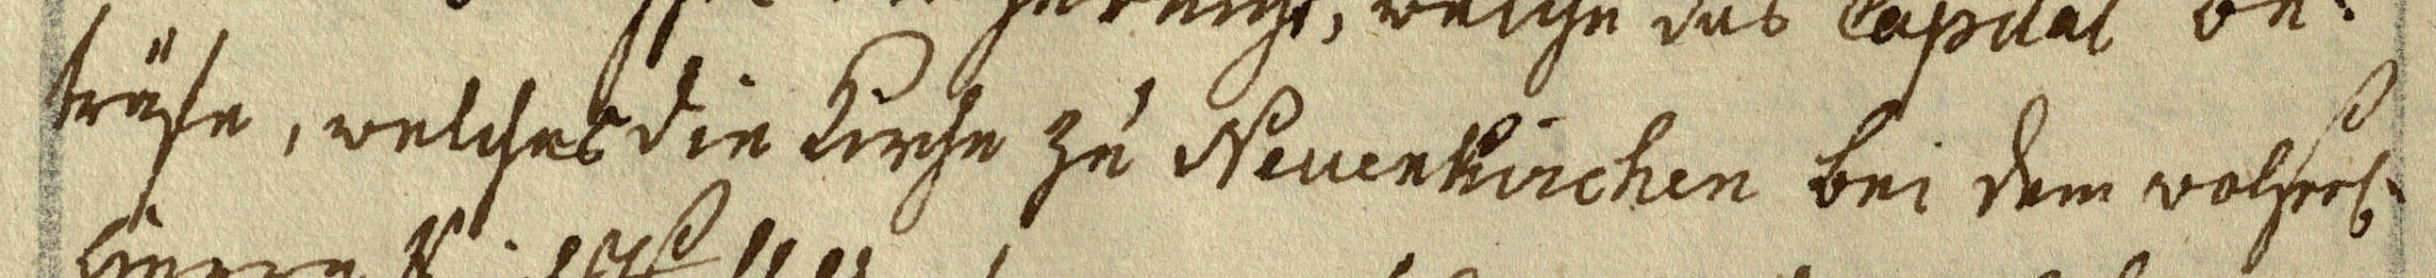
träfe, welches die Kirche zu Neuenkirchen bei dem wolseel.
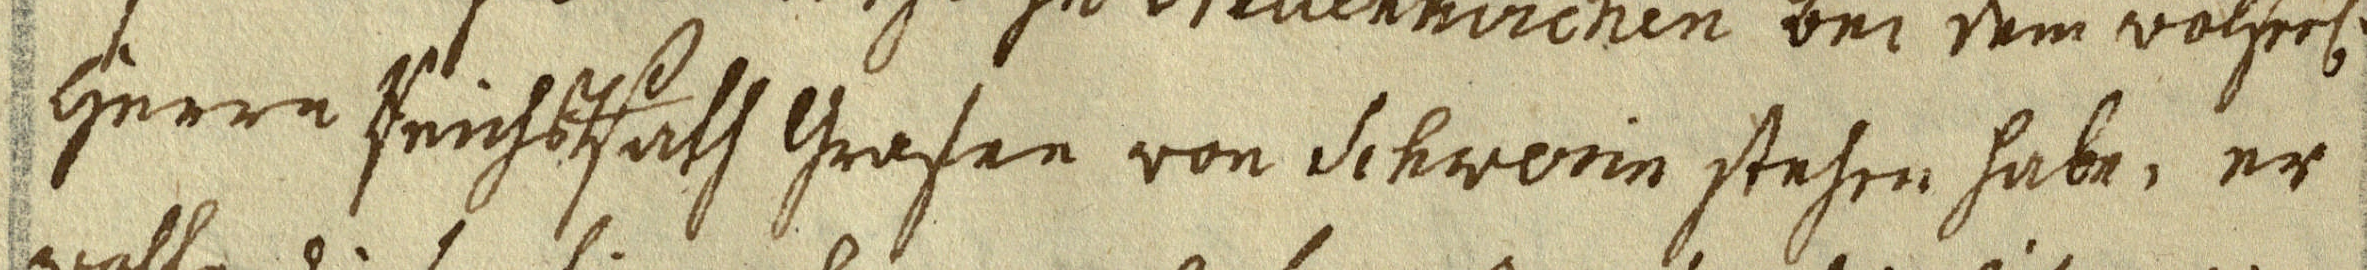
Herrn ReichsRath Grafen von Schwerin stehen habe, er
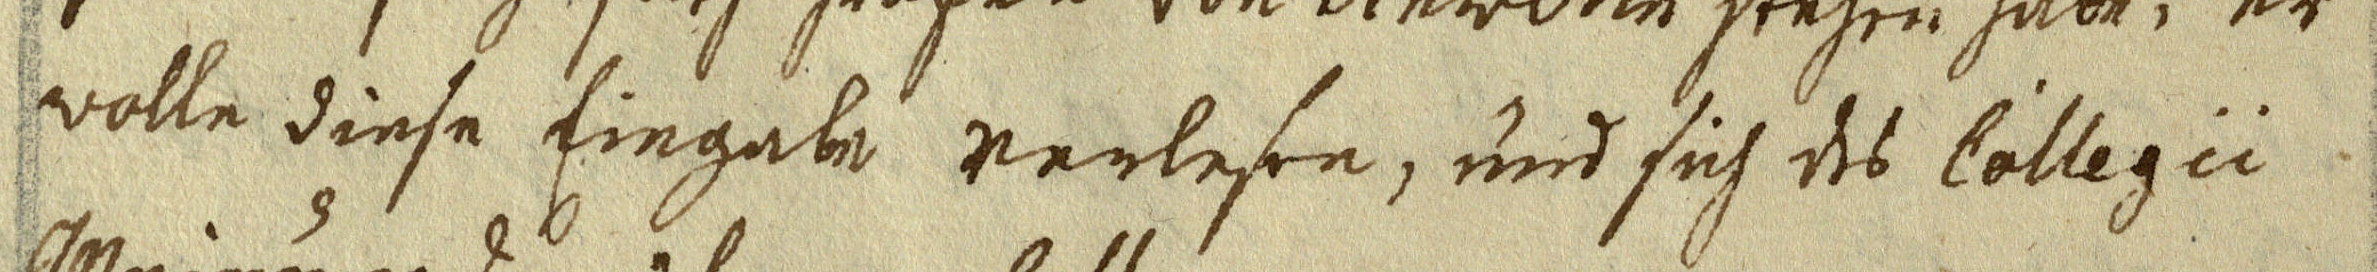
wolle diese Eingabe verlesen, und sich des Collegii
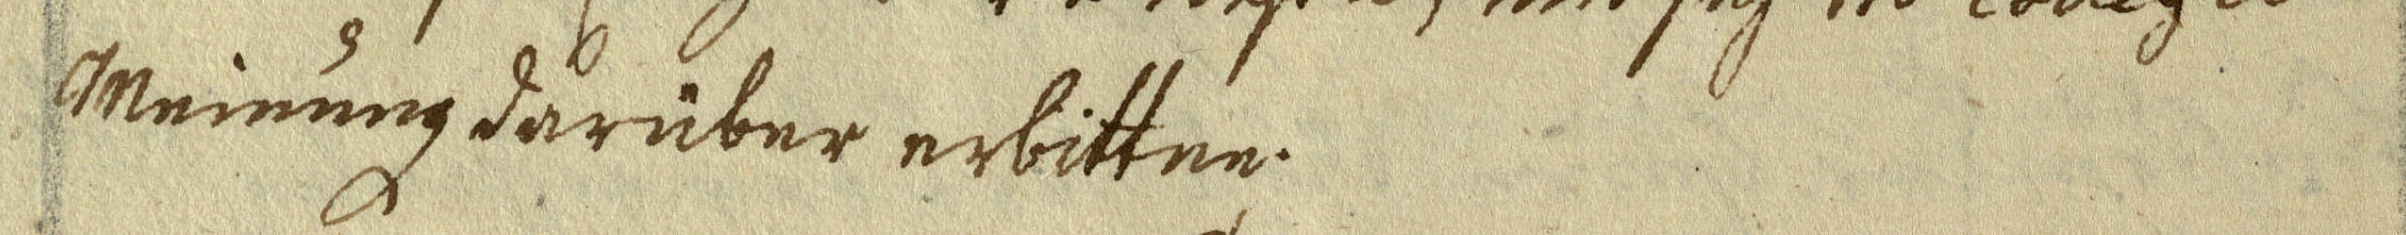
Meinung darüber erbitten.
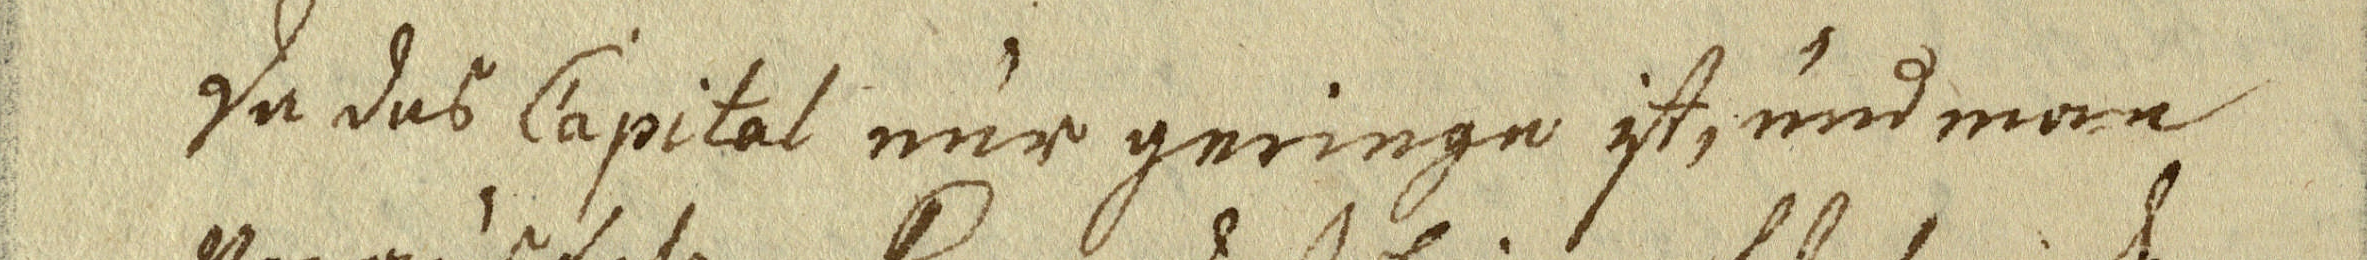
Da das Capital nur geringe ist, und man
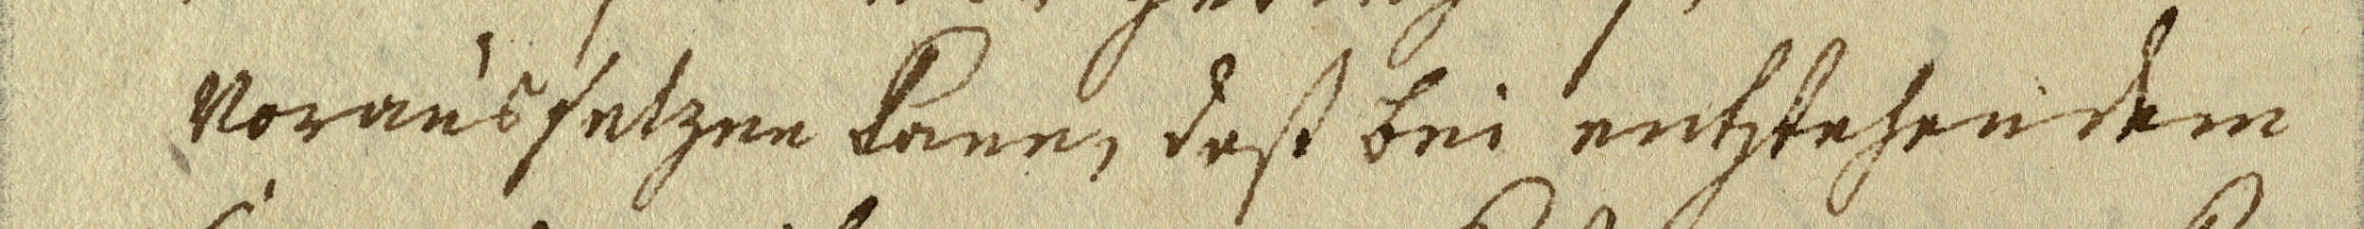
voraussetzen kann, daß bei entstehendem
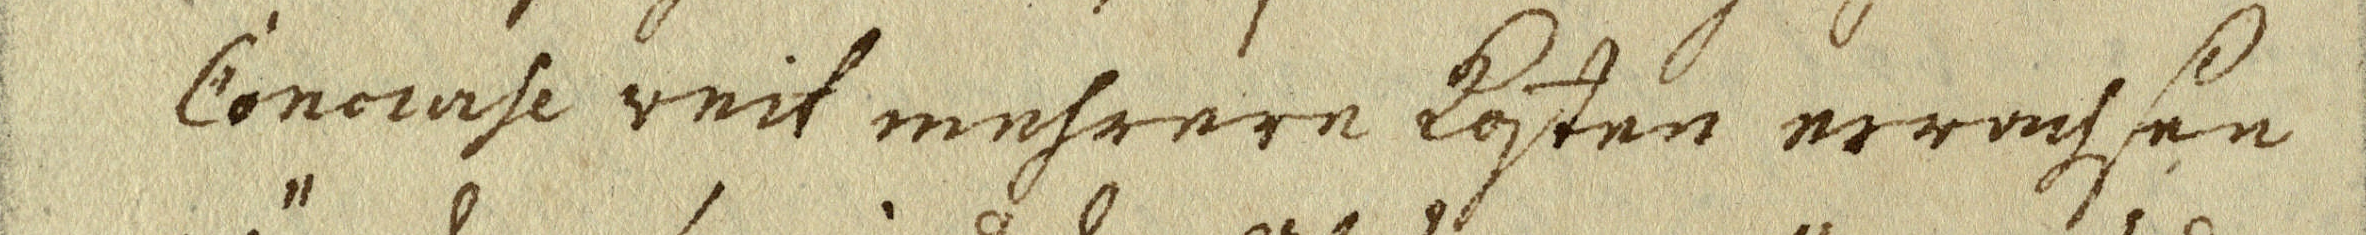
Concurse weit mehrere Kosten erwachsen
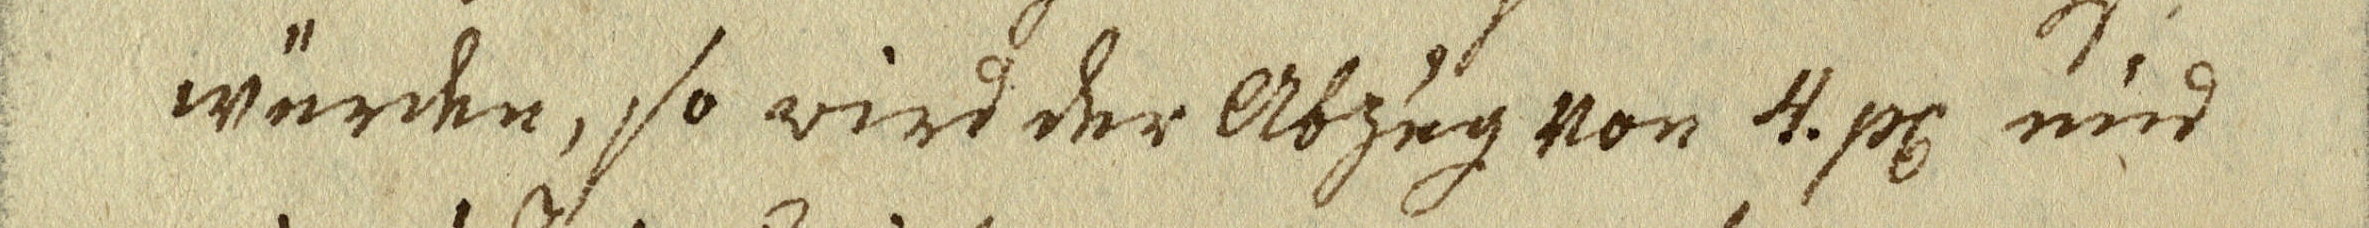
würden, so wird der Abzug von 4 pc. und
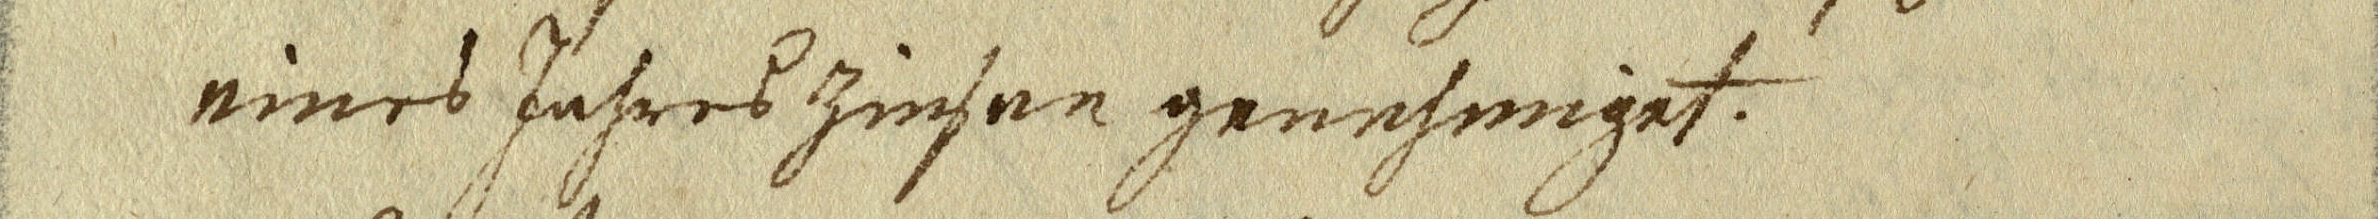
eines Jahres Zinsen genehmiget.
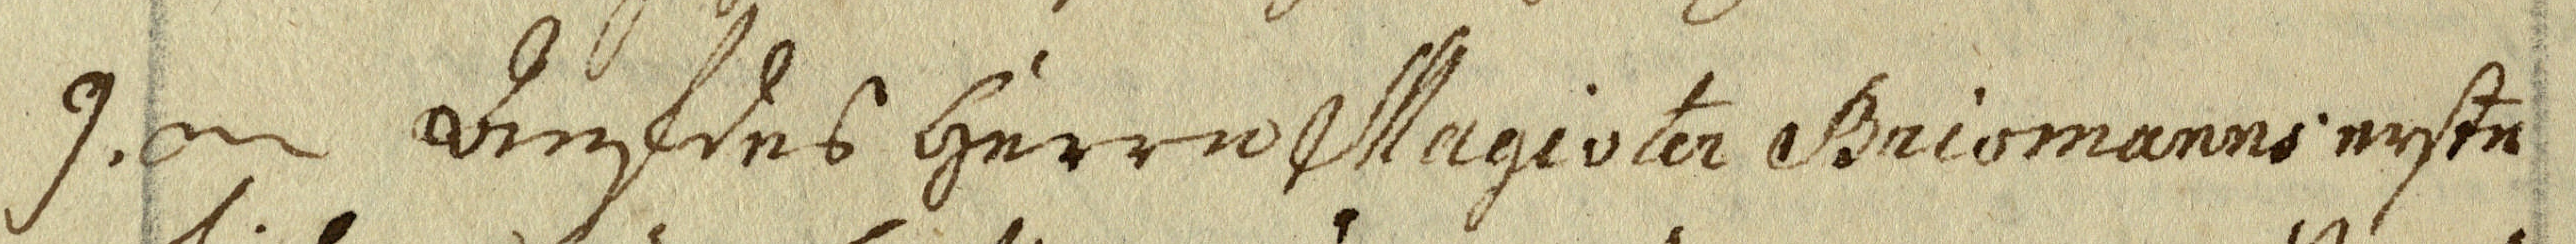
9. Auf des Herrn Magister Brismanns erste
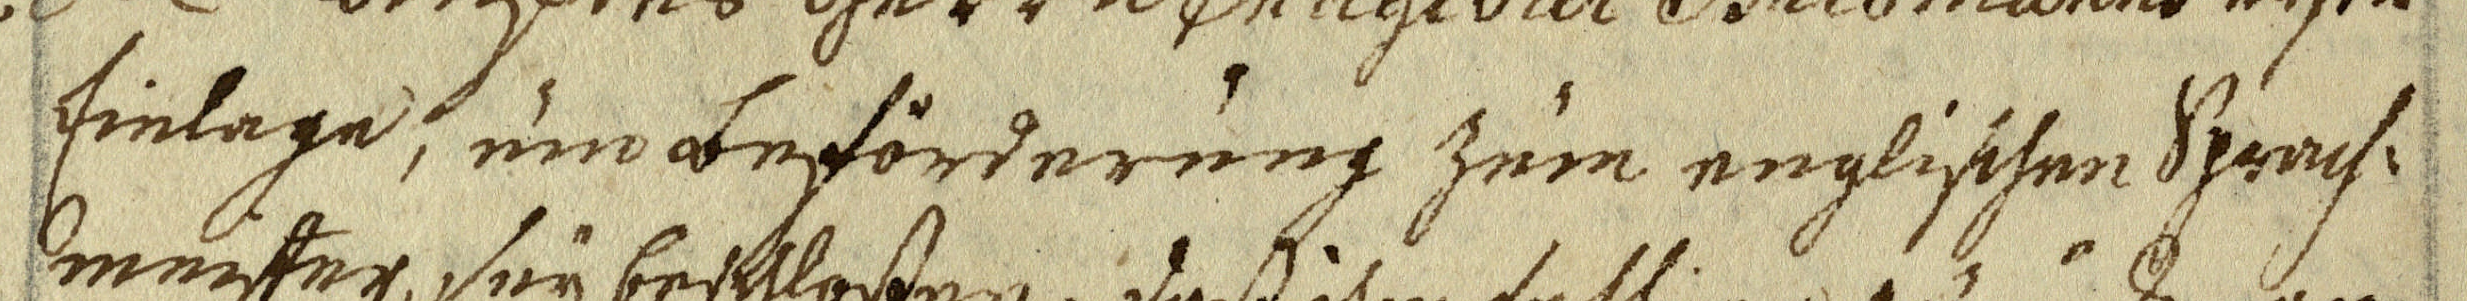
Einlage, um Beförderung zum englischen Sprach¬
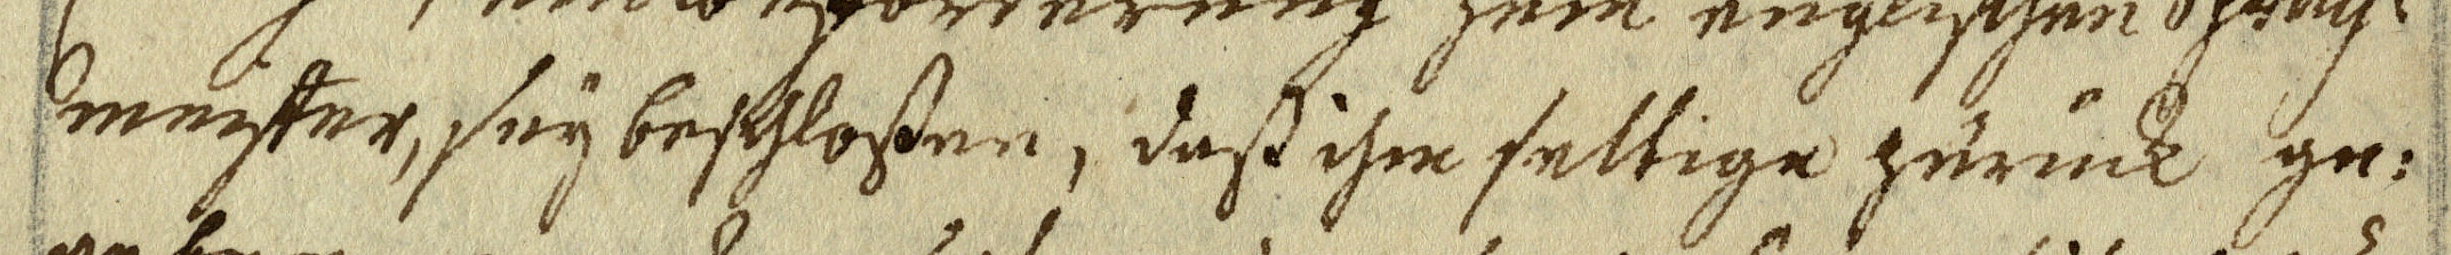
meister, seÿ beschloßen, daß ihm selbige zurück ge¬
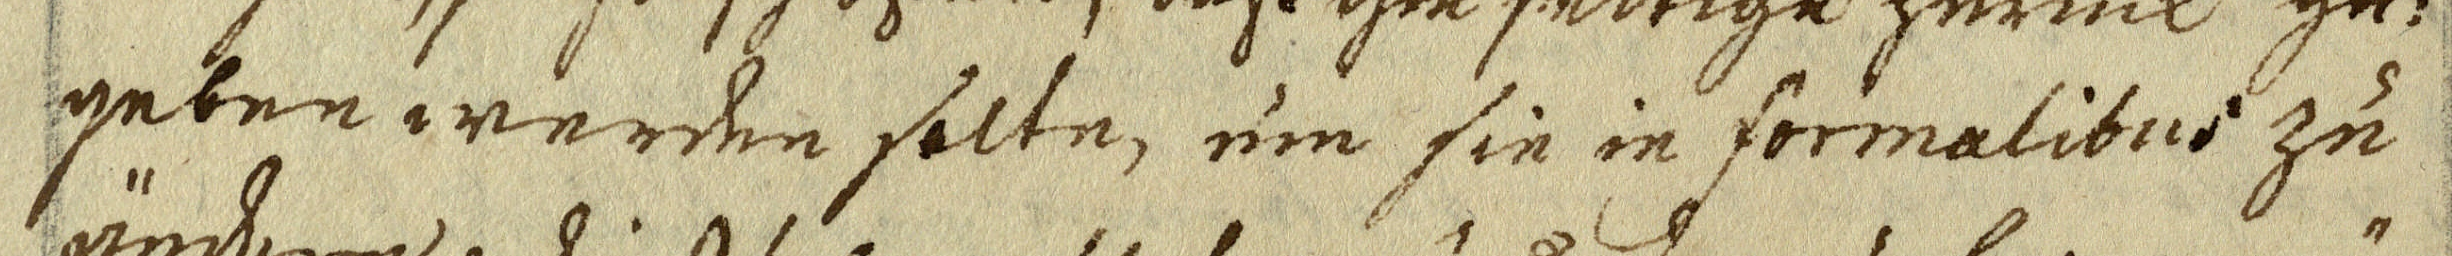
geben werden solte, um sie in formalibus zu
